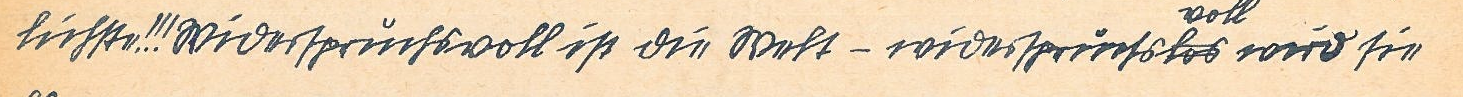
lichste!!! Widerspruchsvoll ist die Welt — widerspruchslos wird sie
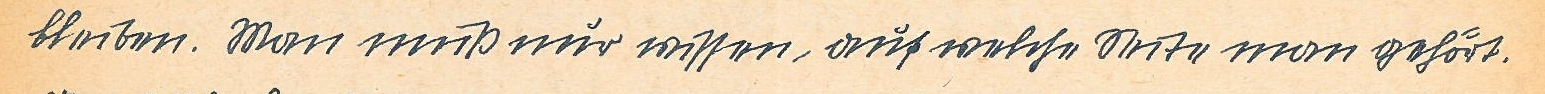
bleiben. Man muß nur wissen, auf welche Seite man gehört.
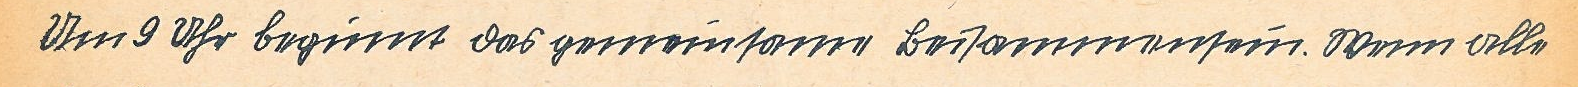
Um 9 Uhr beginnt das gemeinsame Beisammensein. Wenn alle
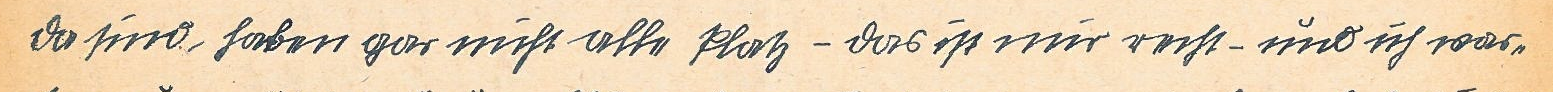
da sind, haben gar nicht alle Platz — das ist mir recht — und ich war¬
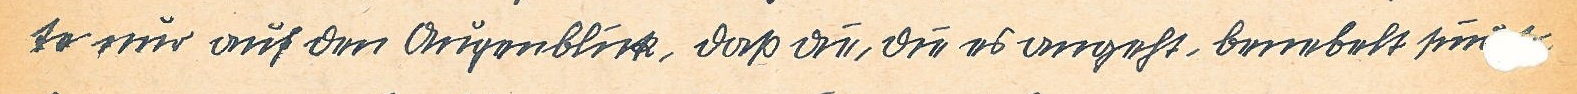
te nur auf den Augenblick, daß die, die es angeht, benebelt sin
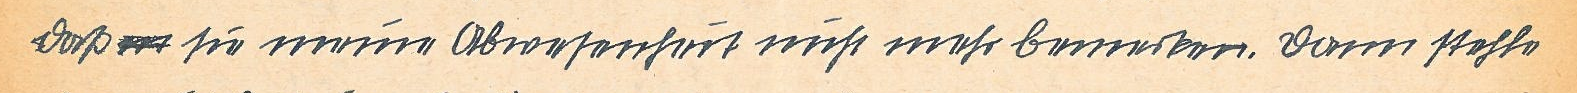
daß m sie meine Abwesenheit nicht bemerken. Dann stelle
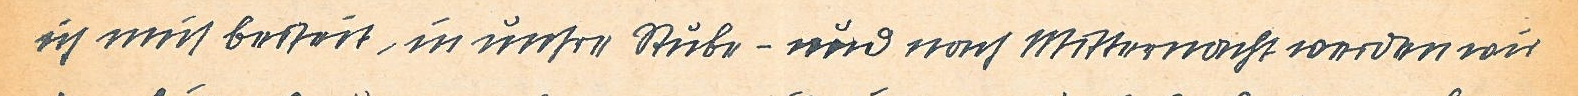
ich mich beiseit, in uns[e]re Stube — und nach Mitternacht werden wir
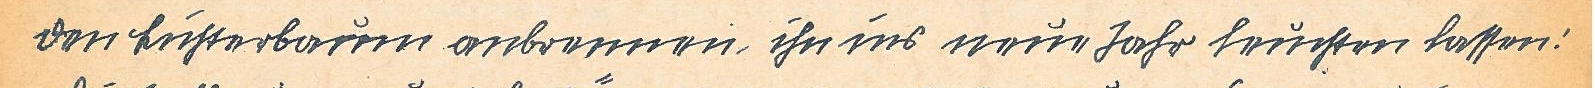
den Lichterbaum anbrennen, ihn ins neue Jahr leuchten lassen:
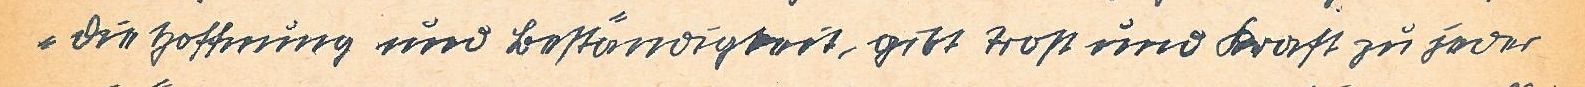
“Die Hoffnung und Beständigkeit, gibt Trost und Kraft zu jeder
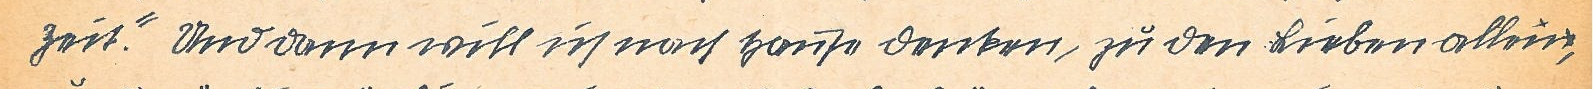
ZeitUnd dann will ich nach Hause denken, zu den Lieben allein,
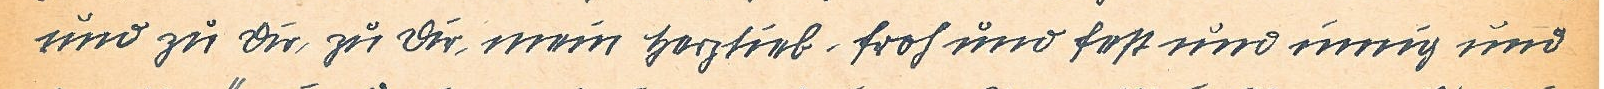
und zu Dir, zu Dir, mein Herzlieb, froh und fest und innig und
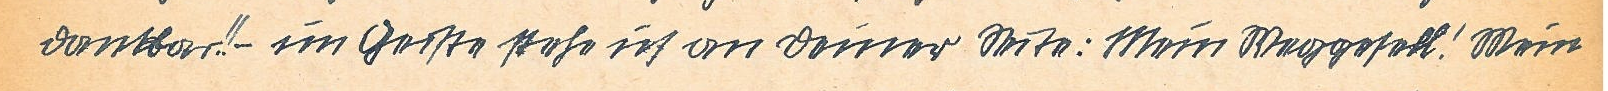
dankbar!! — im Geiste stehe ich an Deiner Seite: Mein Weggesell! Mein
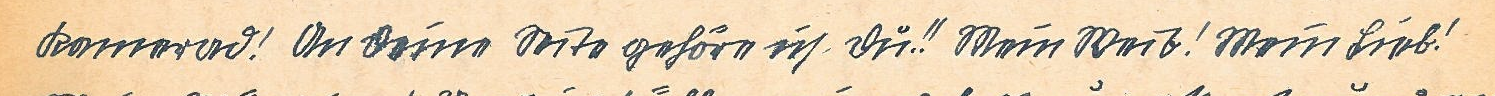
Kamerad! An Deine Seite gehöre ich, Du!! Mein Weib! Mein Lieb!
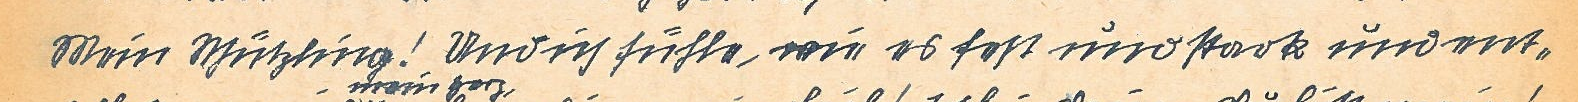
Mein Schützling! Und ich fühle, wie es fest und stark und ent¬
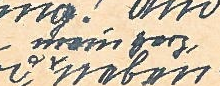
mein Herz
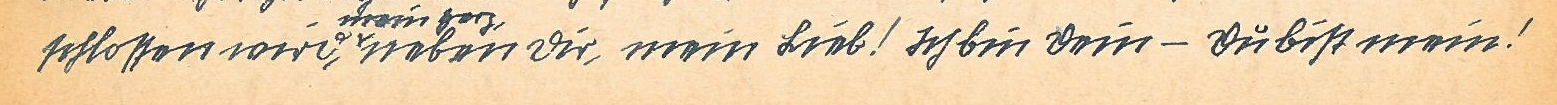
schlossen wird, neben Dir, mein Lieb! Ich bin Dein — Du bist mein!
